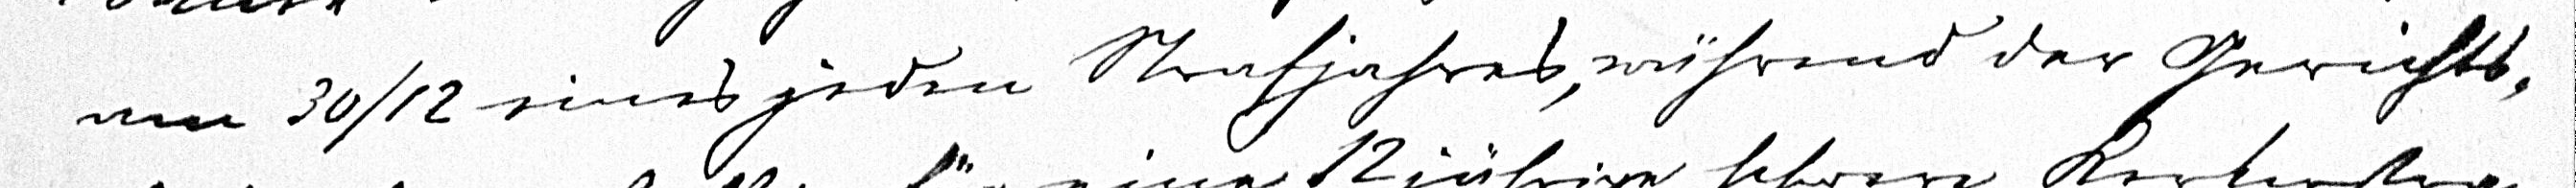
am 30/12 eines jeden Strafjahres, während der Gerichts¬
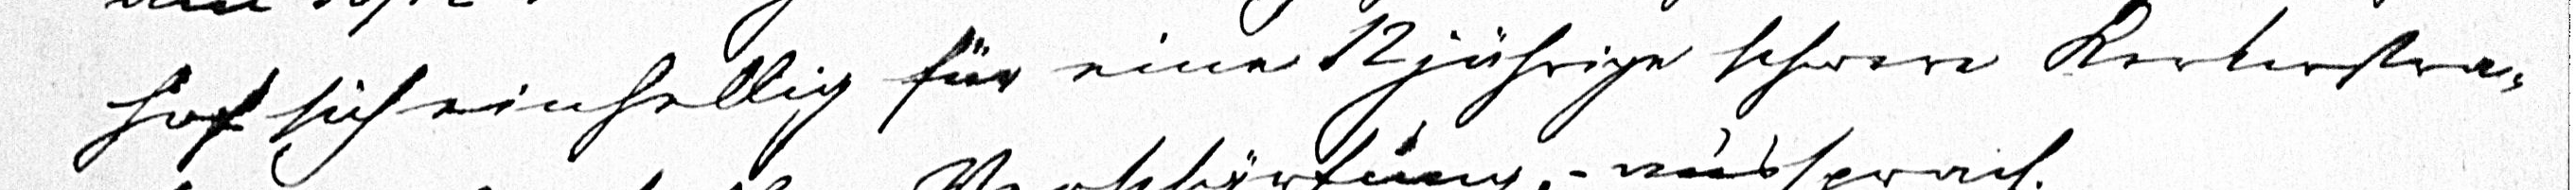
hof sich einhellig für eine 12jährige schwere Kerkerstra¬
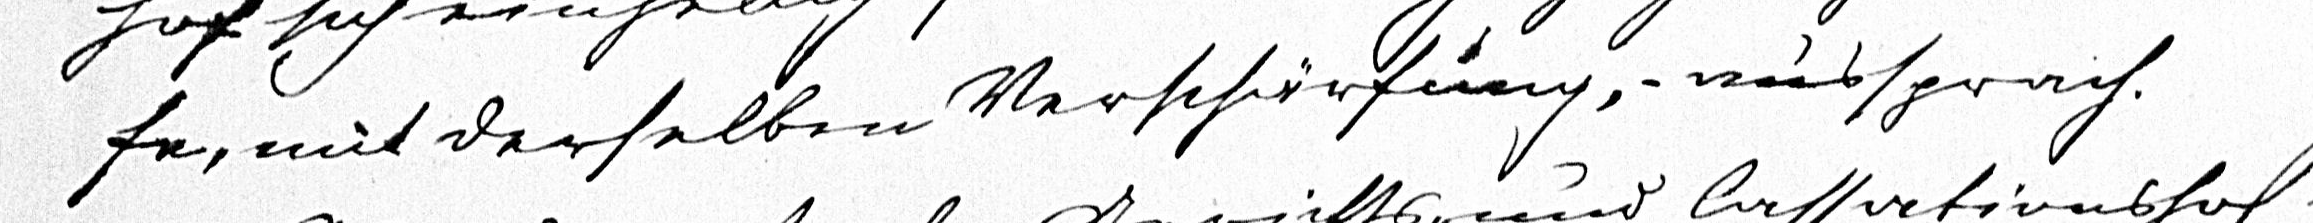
fe, mit derselben Verschärfung,- aussprach.
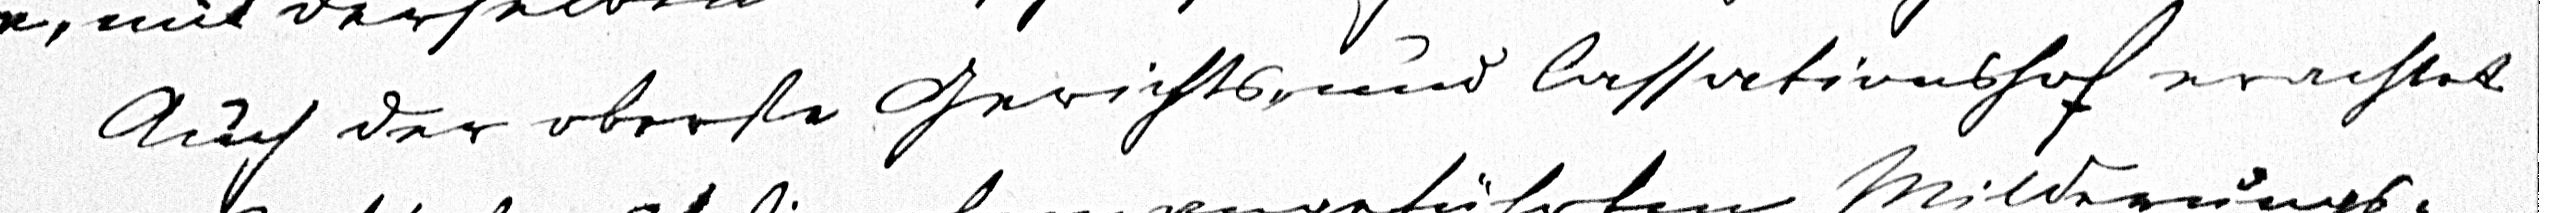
Auch der oberste Gerichts- und Cassationshof erachtet
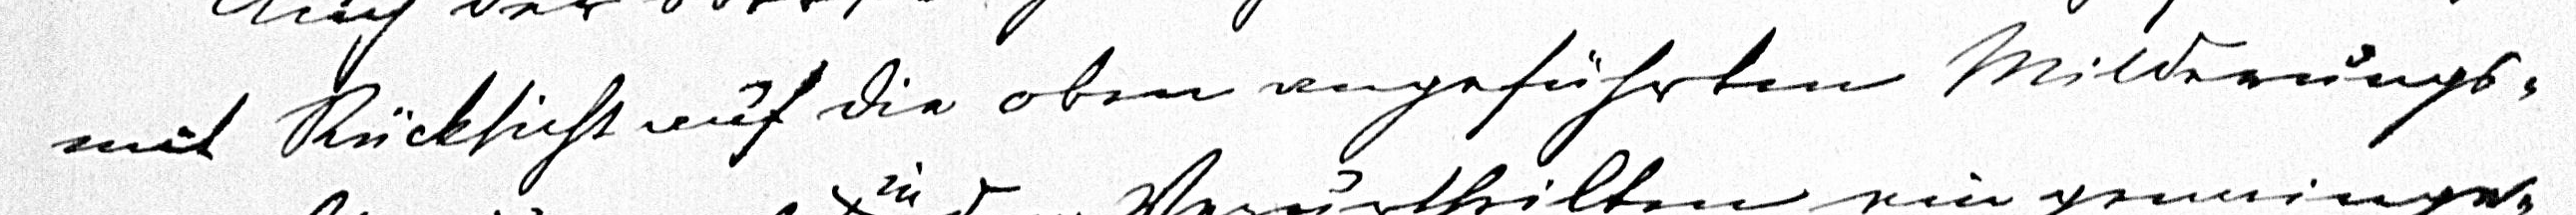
mit Rücksicht auf die oben angeführten Milderungs¬
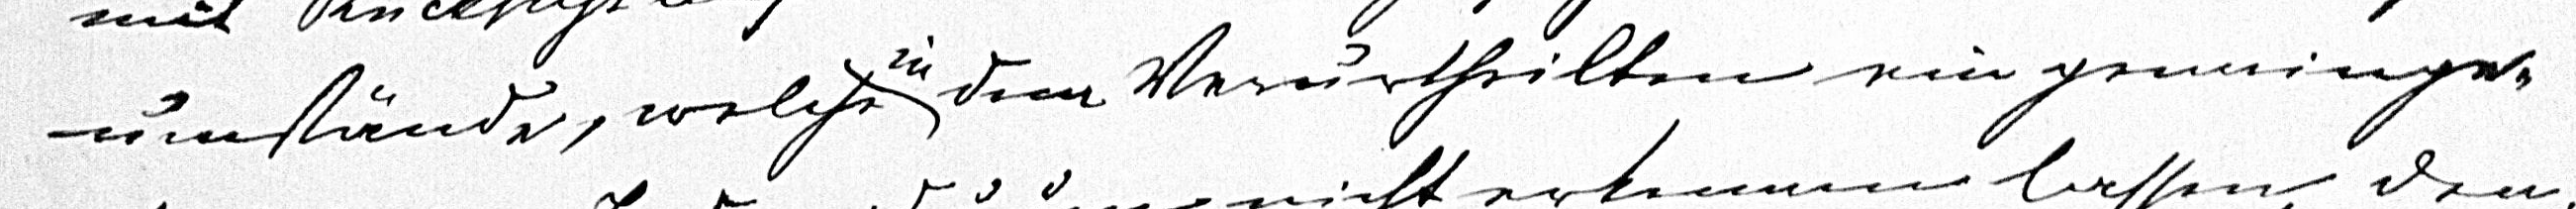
umstände, welche in dem Verurtheilten ein gemeinge¬
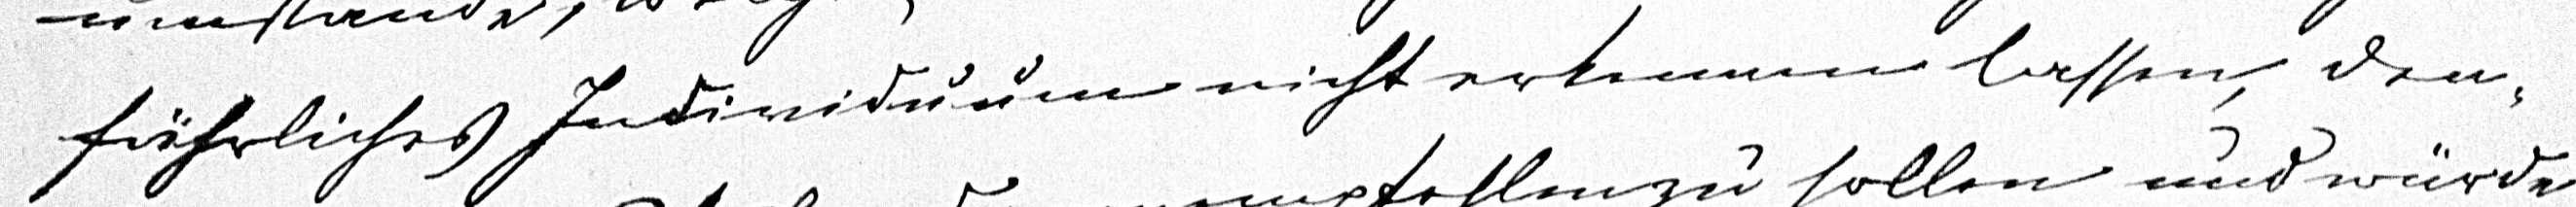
fährliches Individuum nicht erkennen lassen, den¬
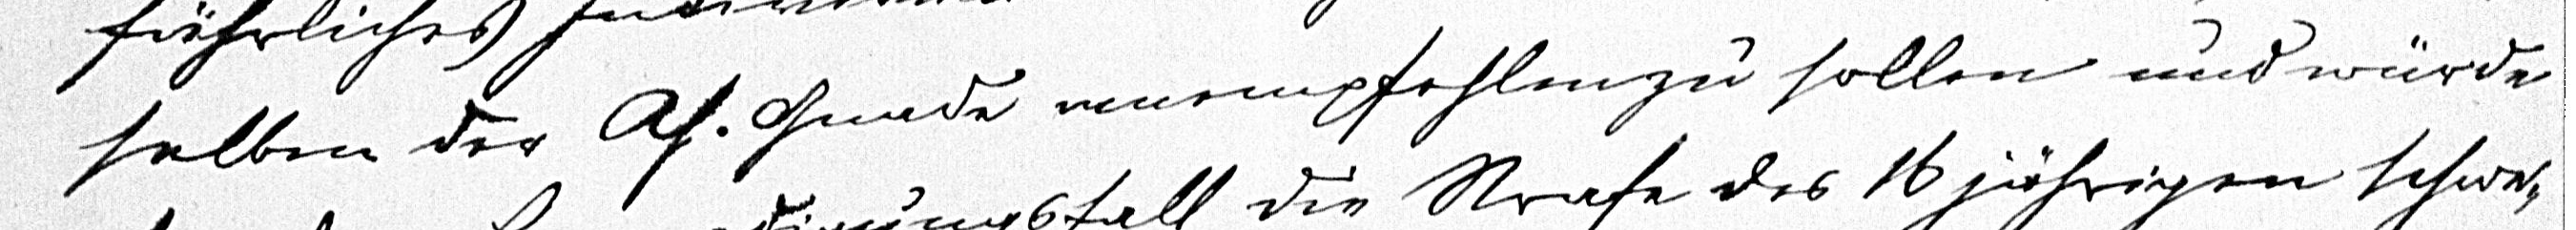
selben der Af. Gnade anempfehlen zu sollen und würde
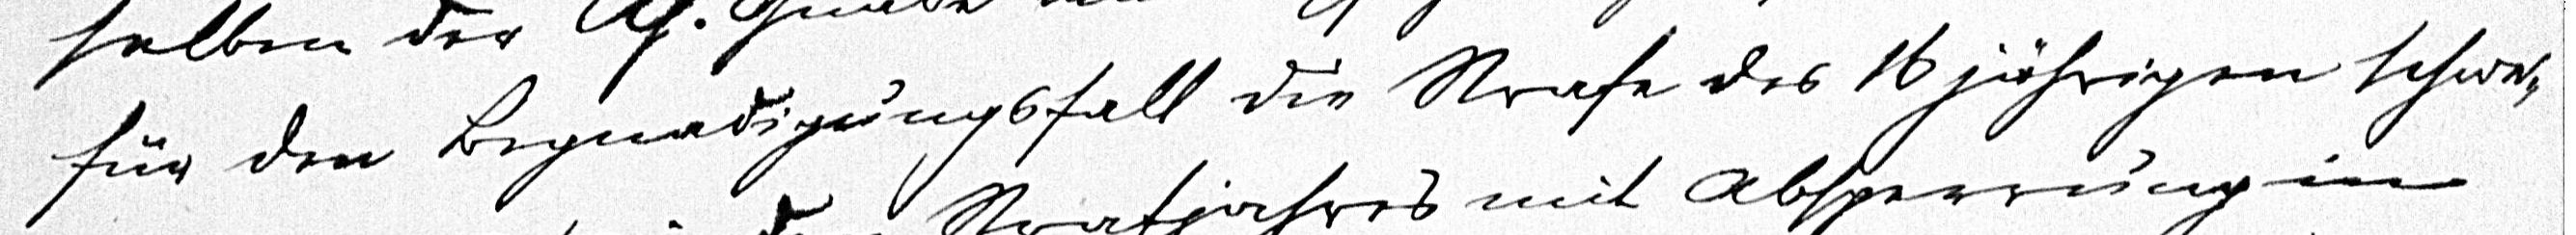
für den Begnadigungsfall die Strafe des 16 jährigen schwe¬
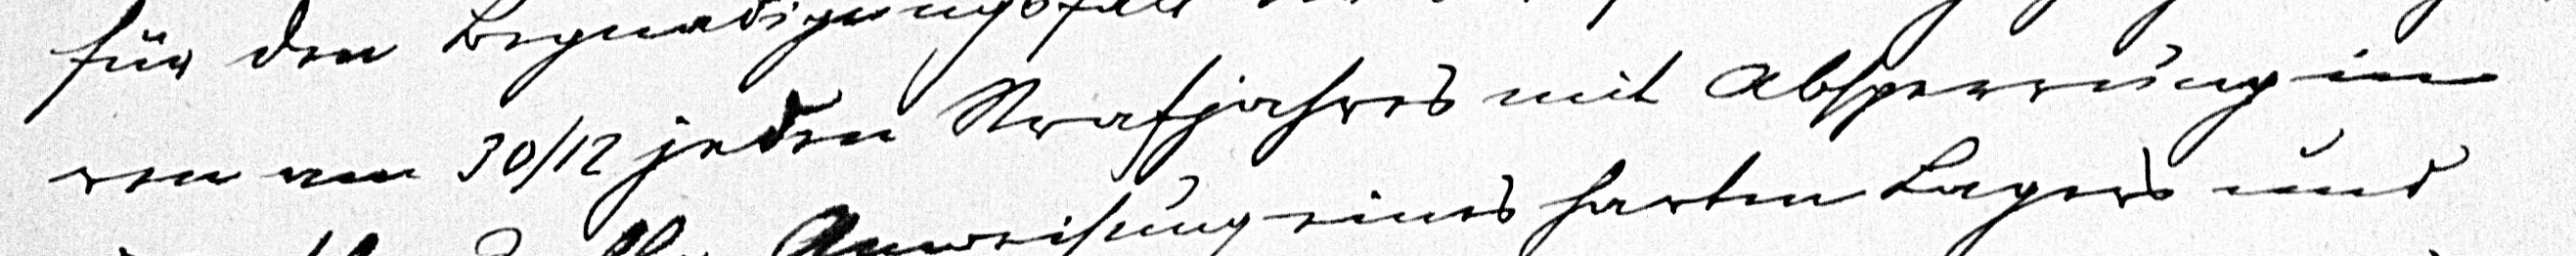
ren am 30/12 jeden Strafjahres mit Absperrung in
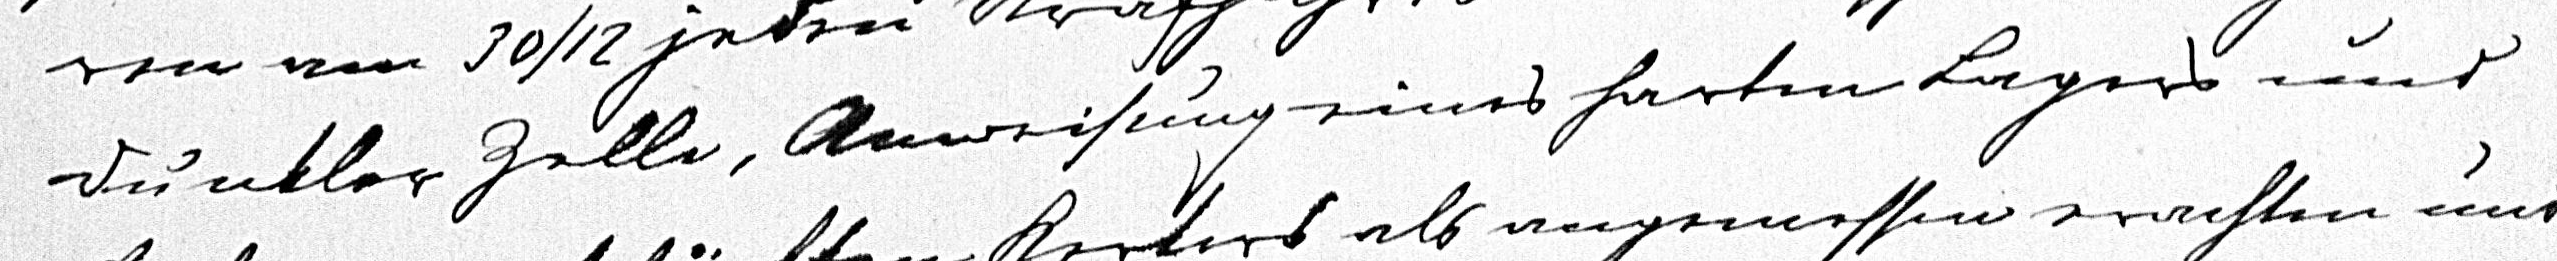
Dunkler Zelle, Anweisung eines harten Lagers und
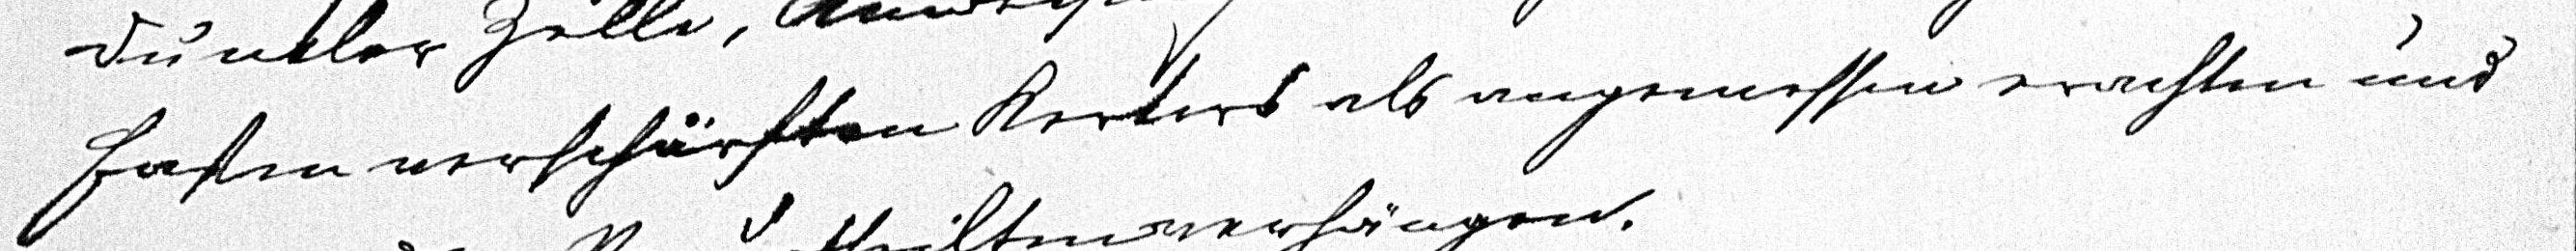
Fasten verschärften Kerkers als angemessen erachten und
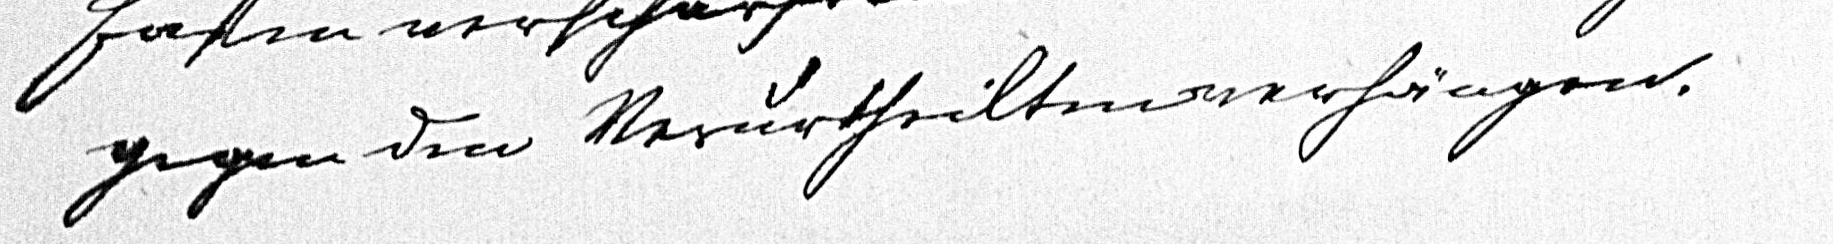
gegen den Verurtheilten verhängen.
